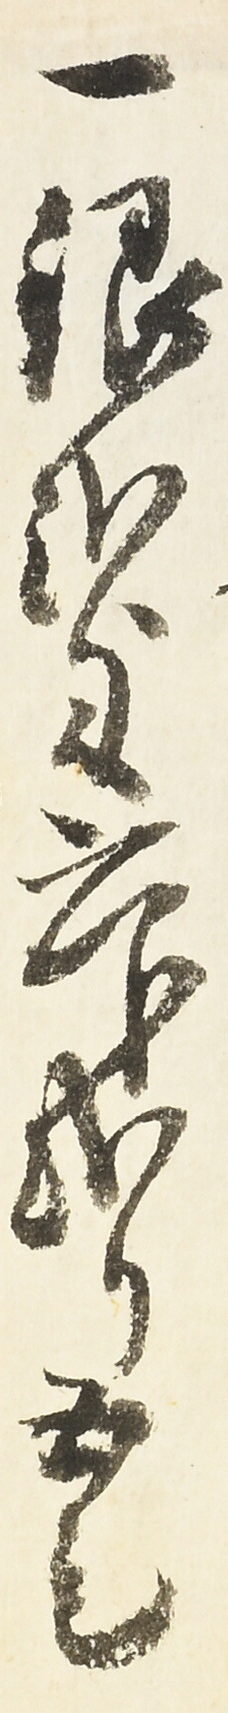一銀弐匁六分弐厘五毛
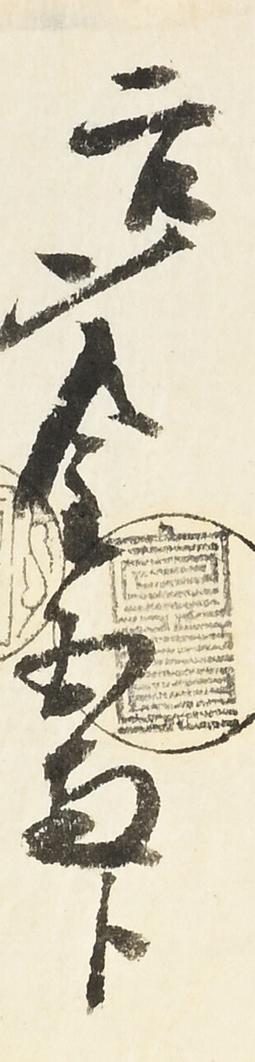ニ口〆金五両ト
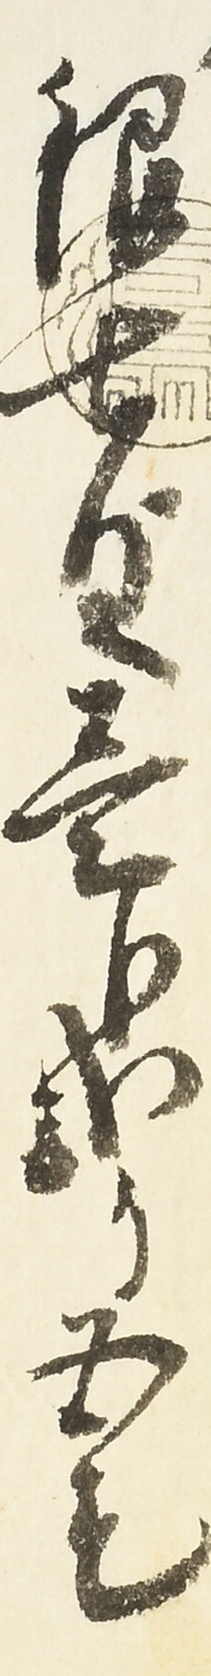銀七匁壱分弐厘五毛
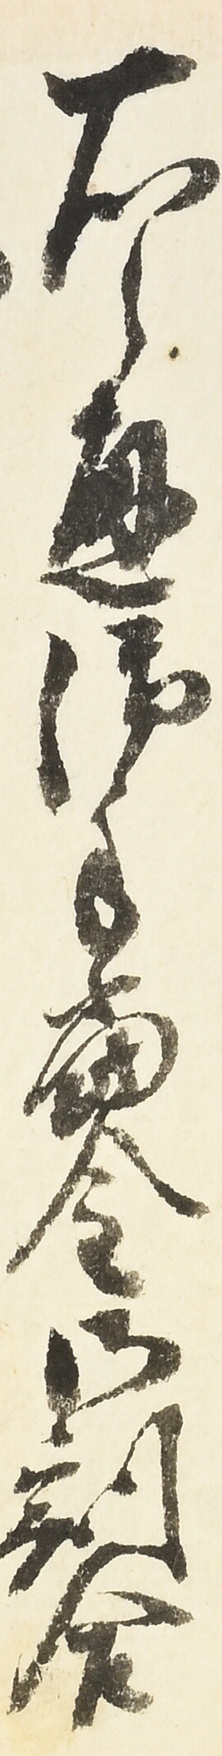右之通御手当金御割合
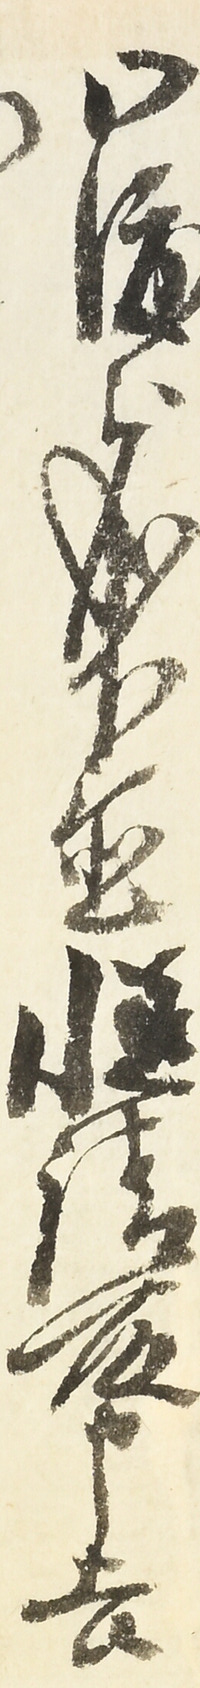御渡被成下置慥請取申上候

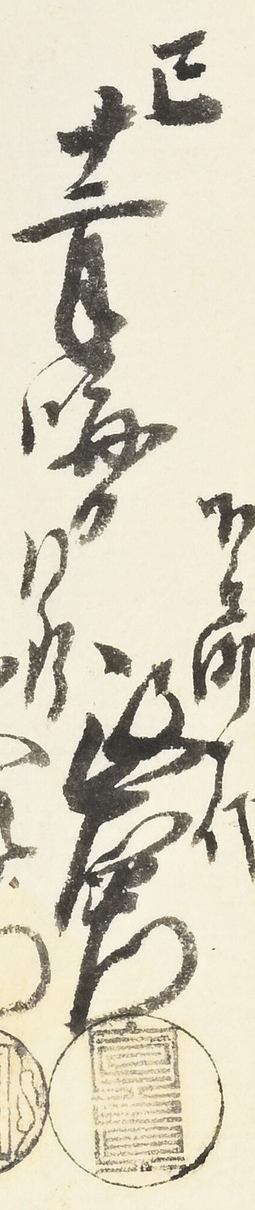十二月晦日同断
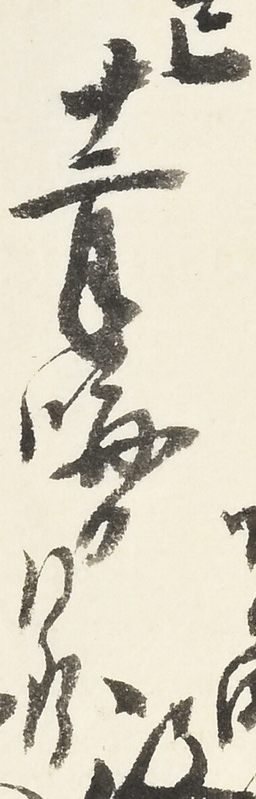十二月晦日同断
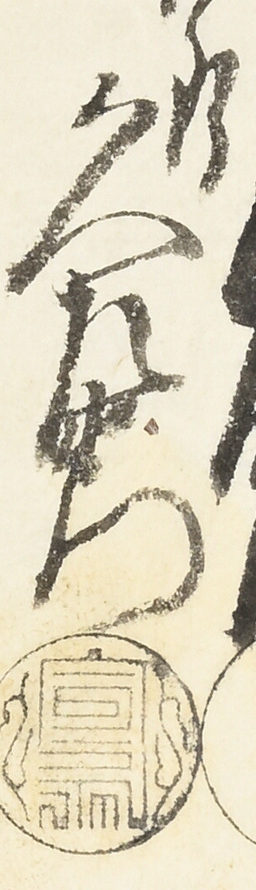久左衛門
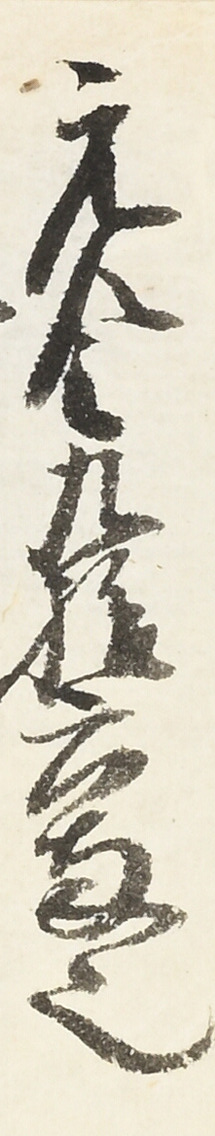元金九拾六両也
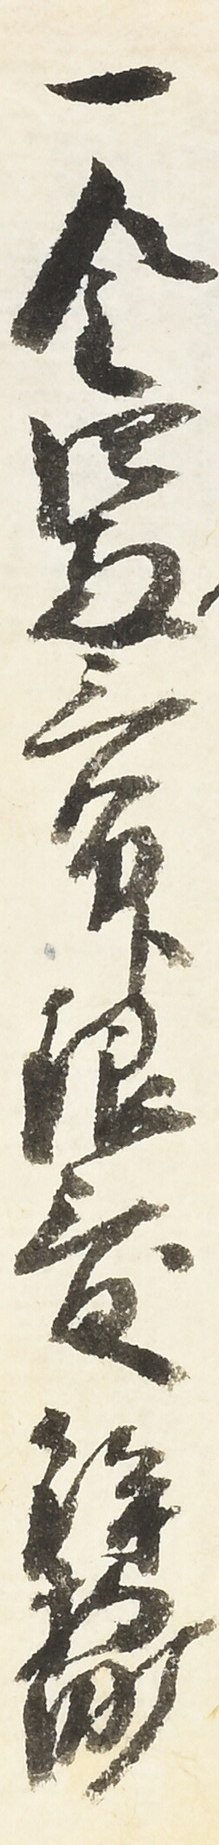一金四両三分ト銀三匁鉾持町
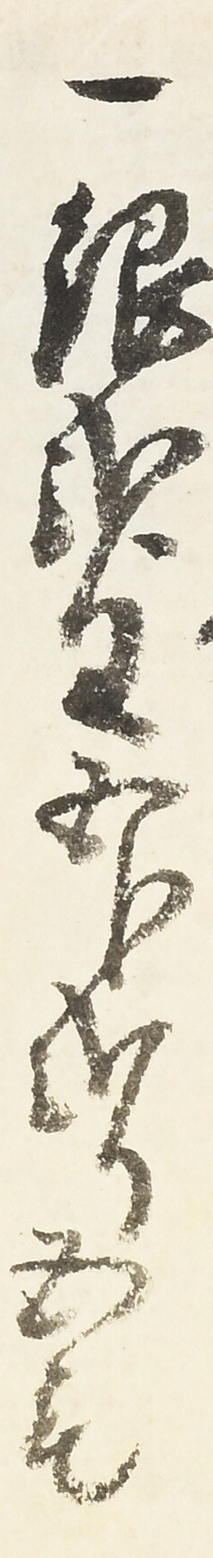一銀弐匁五分弐厘五毛
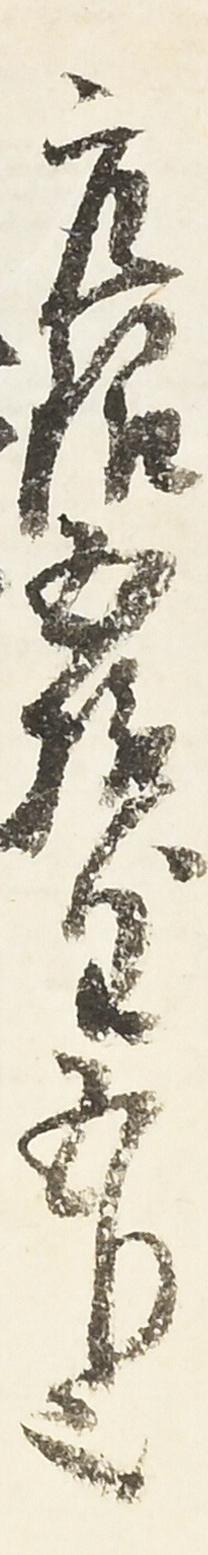元銀五拾匁五分也
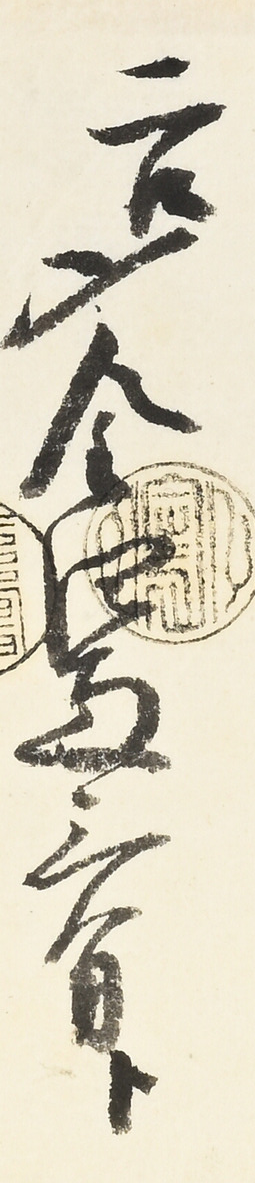二口〆金四両三分ト
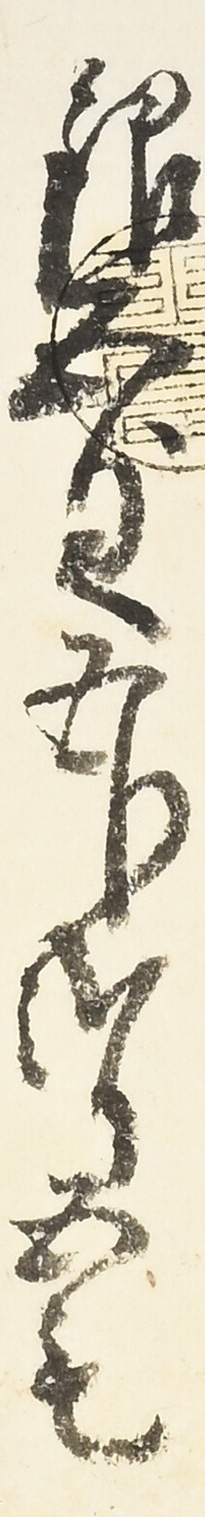銀五匁五分弐厘五毛
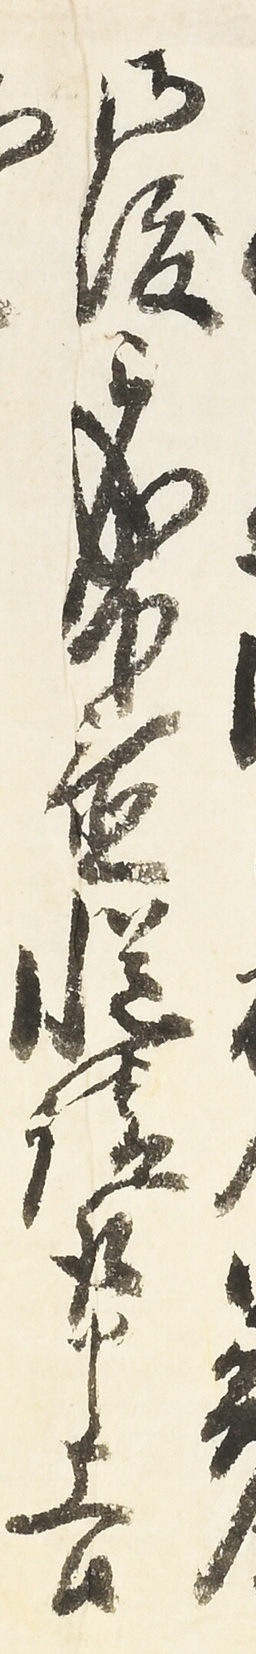御渡被成下置慥請取申上候
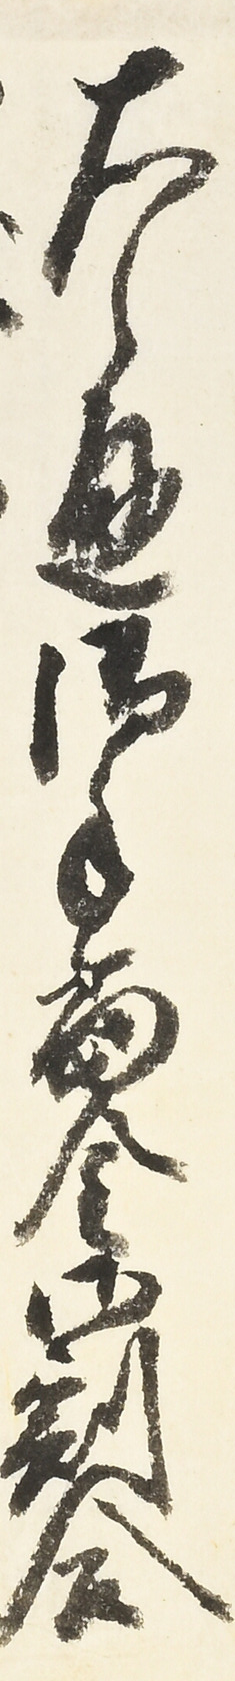右之通御手当金御割合
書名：御才覚金御利足割渡扣帳
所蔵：伊那市立高遠町図書館・合同会社AMANE
